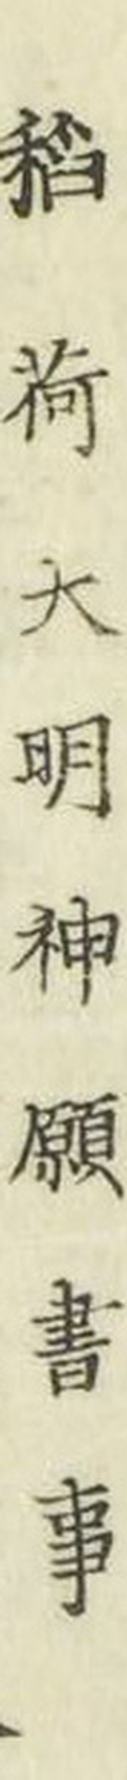稲荷大明神願書事
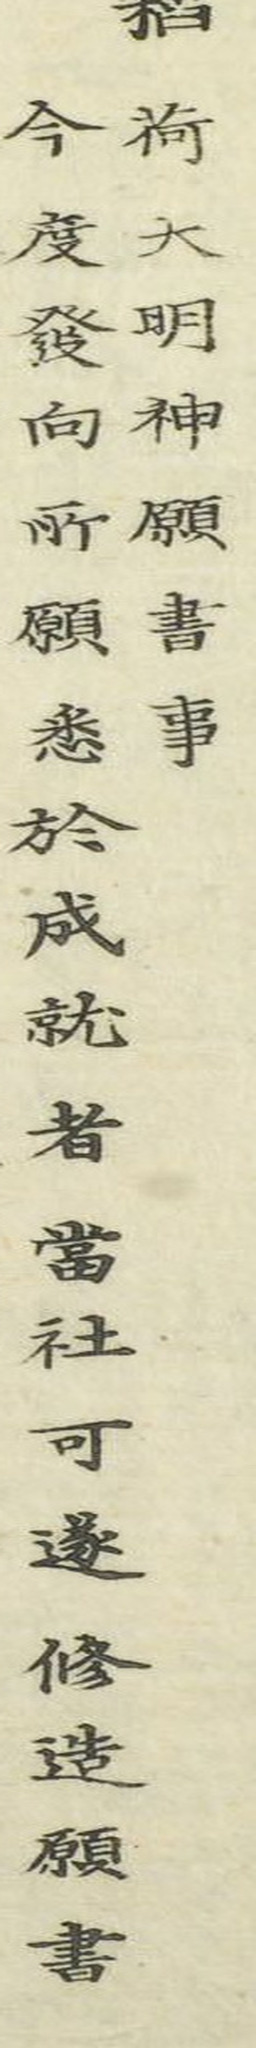今度發向所願悉於成就者當社可遂修造願書
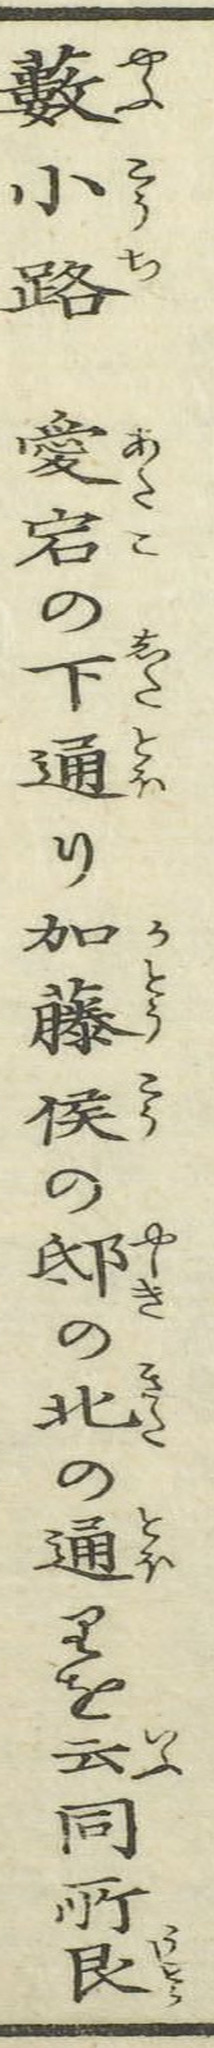藪小路愛宕の下通り加藤侯の邸の北の通りを云同所艮
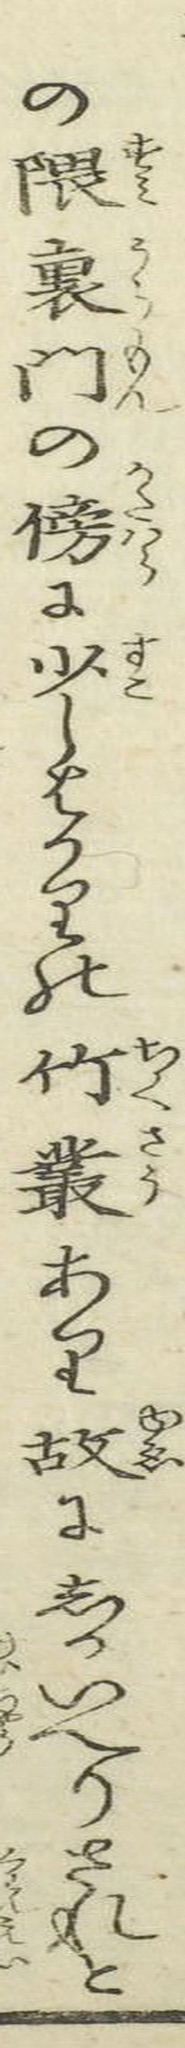の隅裏門の傍に少しはかりの竹叢あり故にしかいへりされと
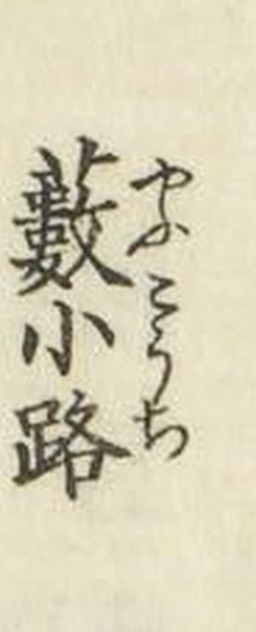藪小路

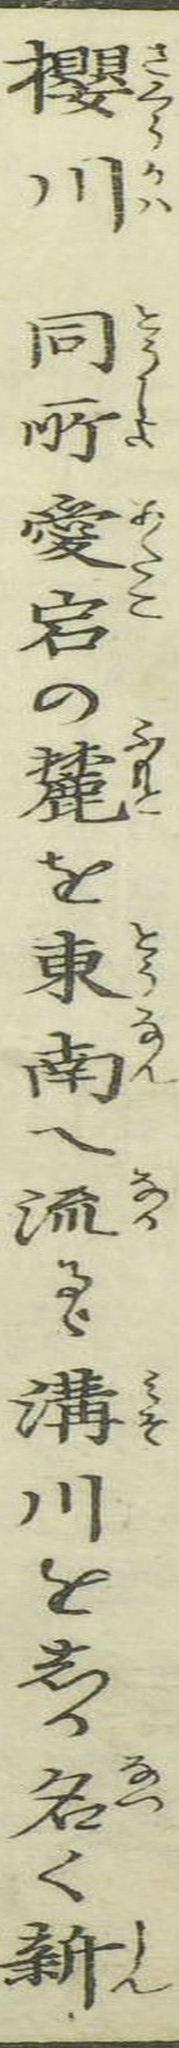櫻川同所愛宕の麓を東南へ流るゝ溝川をしか名く新
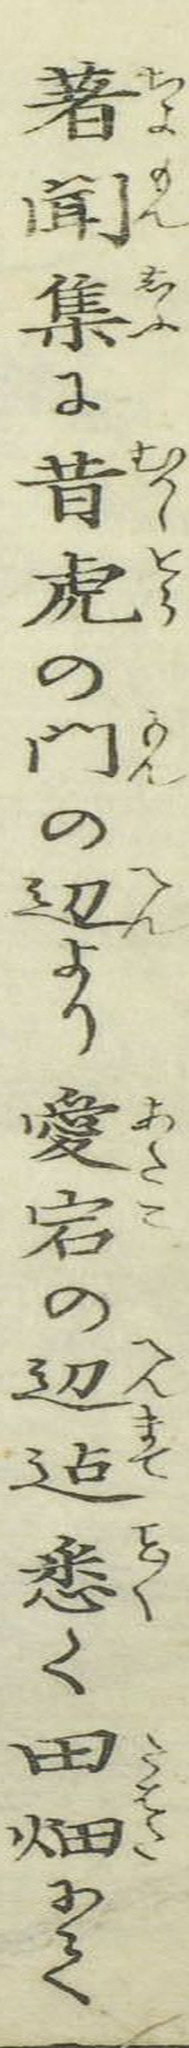著聞集に昔虎の門の辺より愛宕の辺迄悉く田畑にて
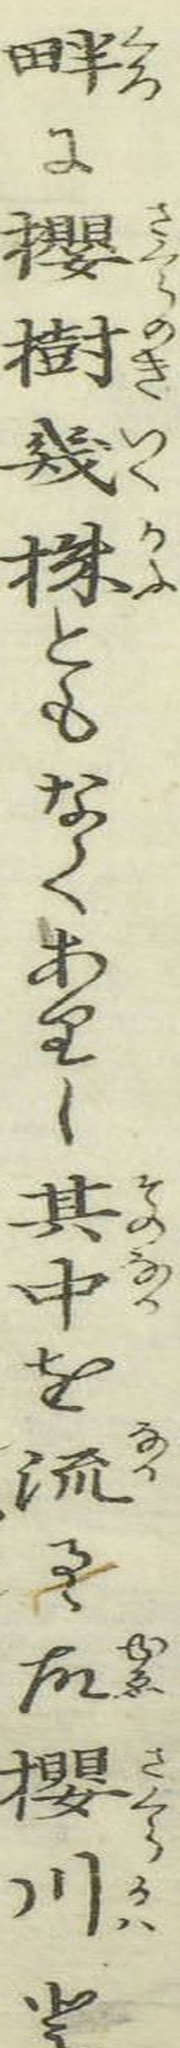畔に櫻樹幾株ともなくありし其中を流るゝ故櫻川と
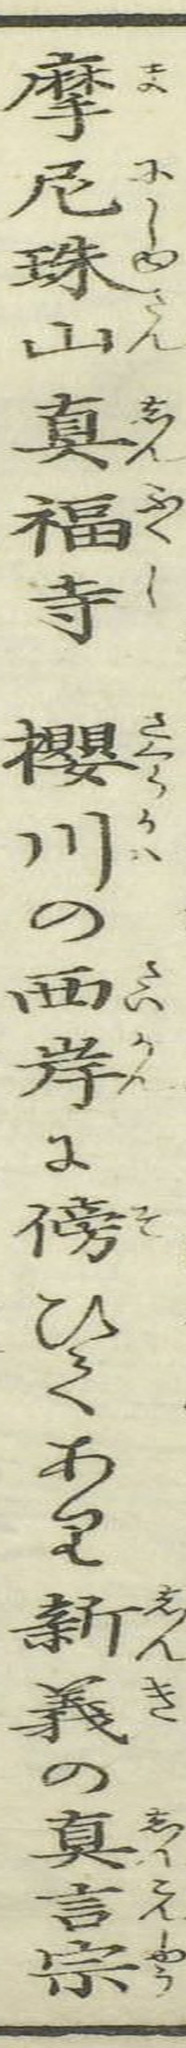摩尼珠山真福寺櫻川の西岸に傍ひてあり真義の真言宗
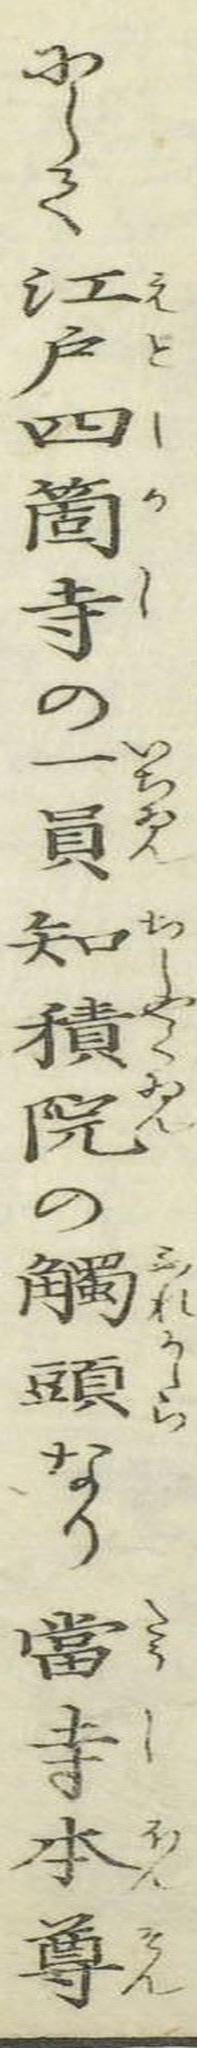にして江戸四箇寺の一員知積院の触頭なり當寺本尊
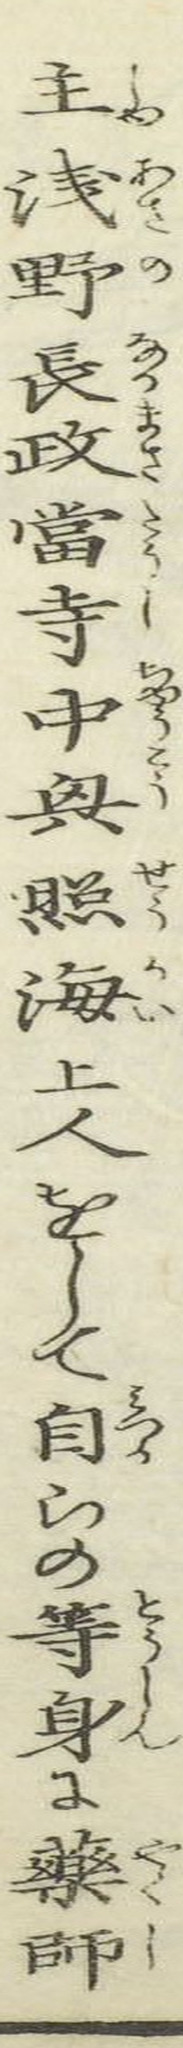主浅野長政當寺中興照海上人をして自らの等身に薬師
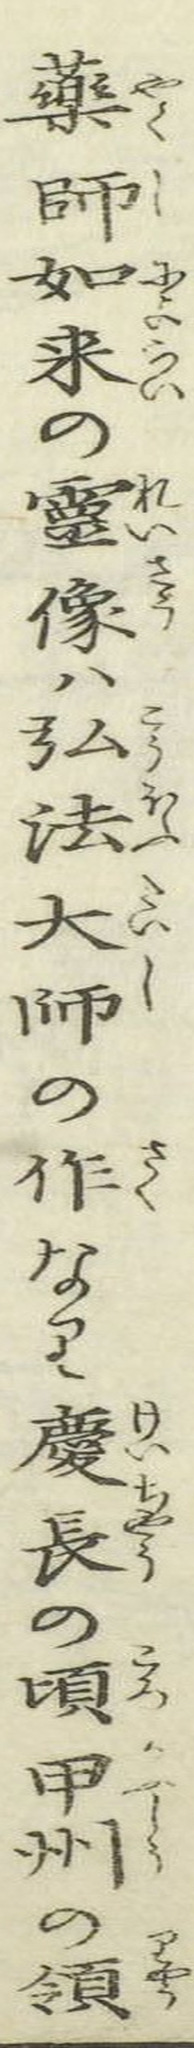薬師如来の霊像は弘法大師の作なり慶長の頃甲州の領
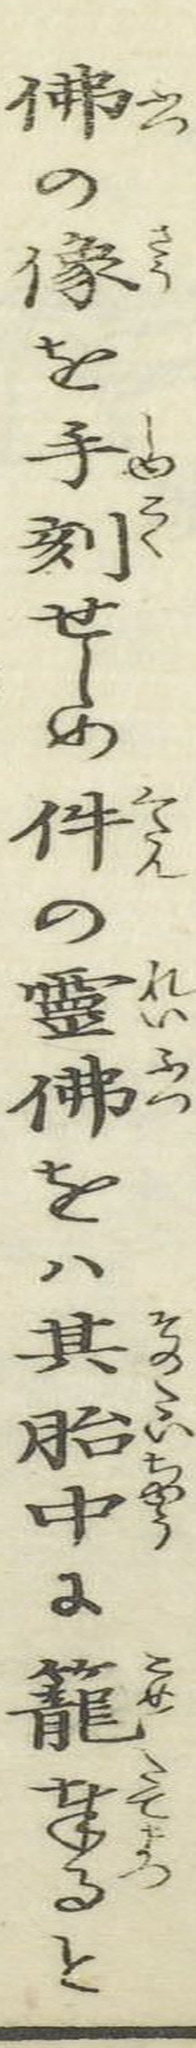佛の像を手刻せしめ件の霊佛をは其胎中に籠奉ると
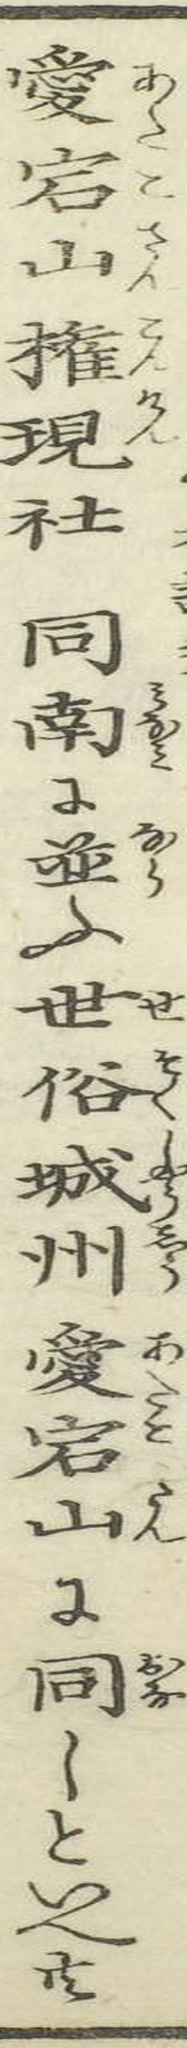愛宕山権現社同南に並ふ世俗城州愛宕山に同しといへ共
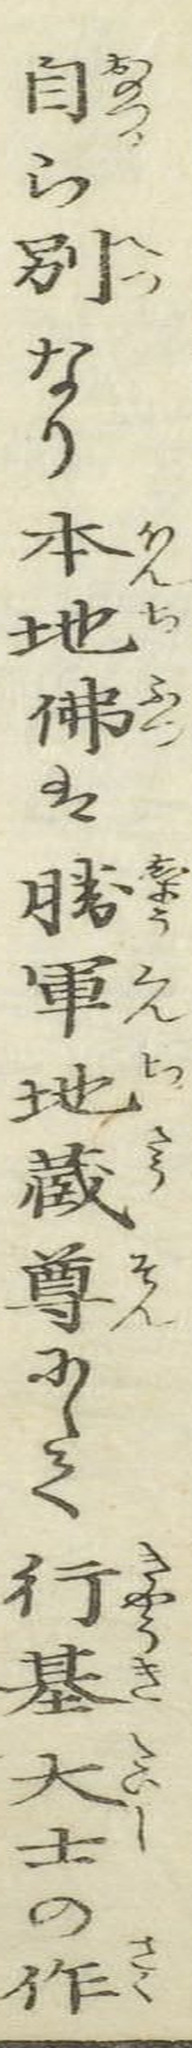自ら別なり本地佛は勝軍地蔵尊にして行基大士の作
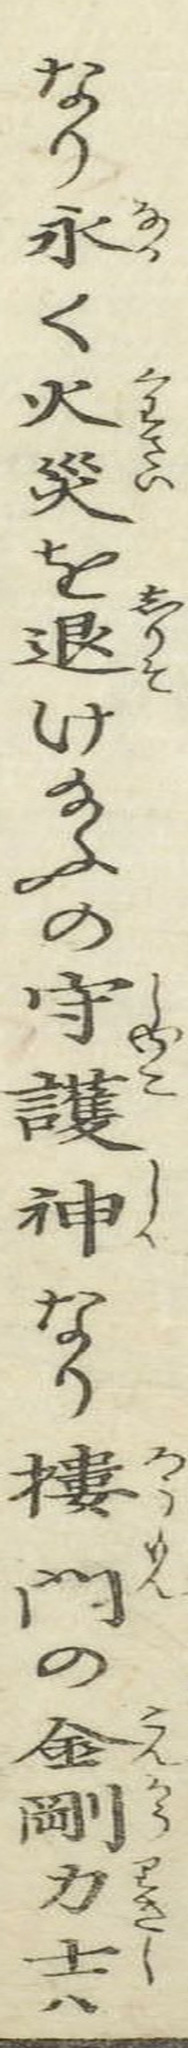なり永く火災を退け給ふの守護神なり楼門の金剛力士は
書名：江戸名所図会 20巻 巻之3
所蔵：東京学芸大学教育コンテンツアーカイブ
